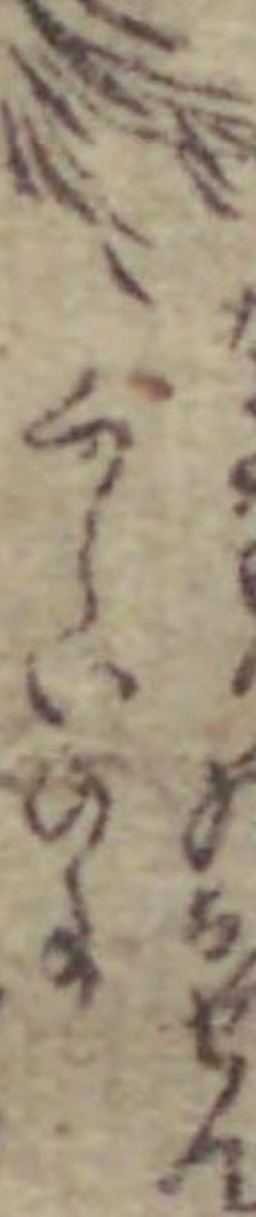くらいの事

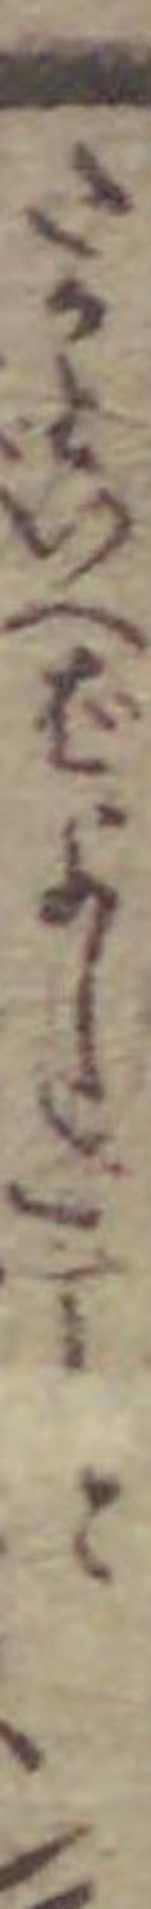たかといへばよしたと
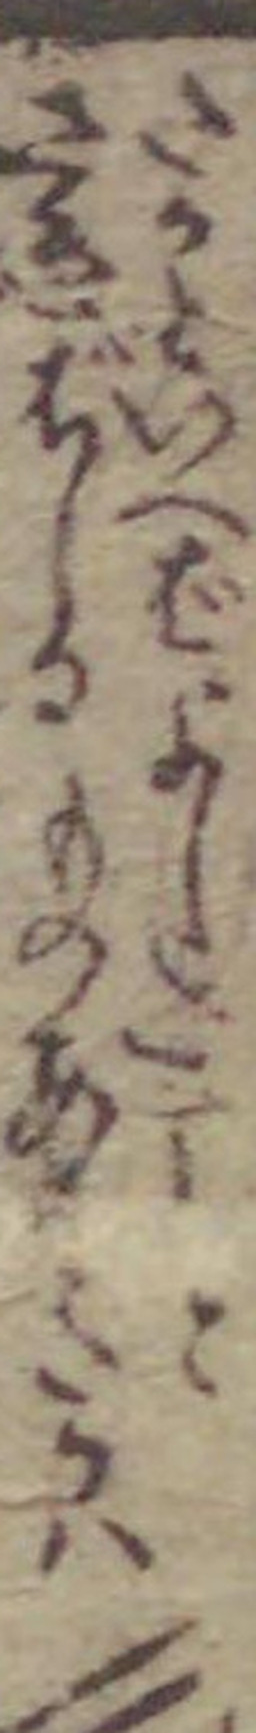さきばしるものあたかハ
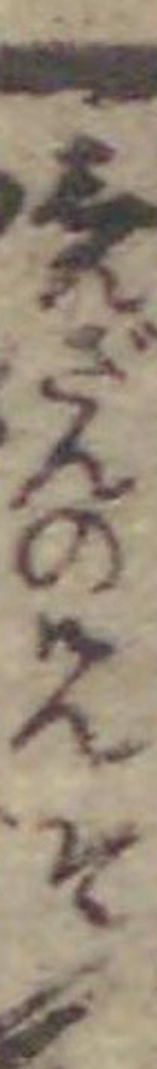しんざんのけんそ
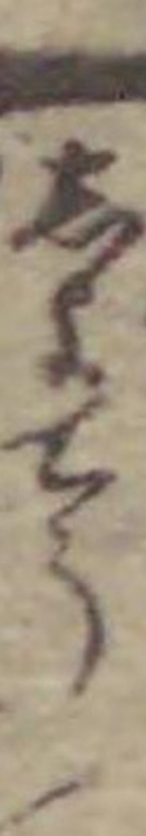しよてう
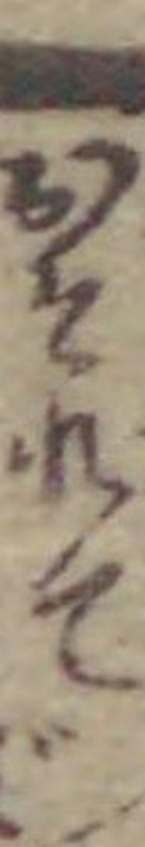おそれて
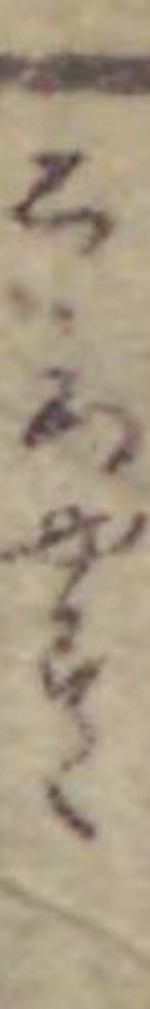こゝろやすく
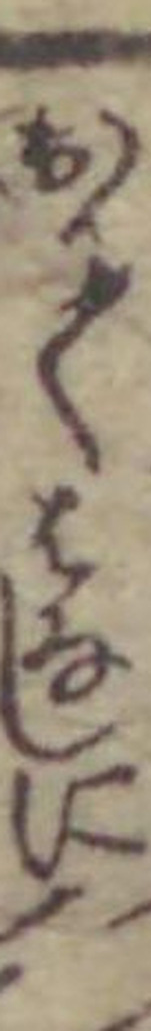おり〳〵はなしに
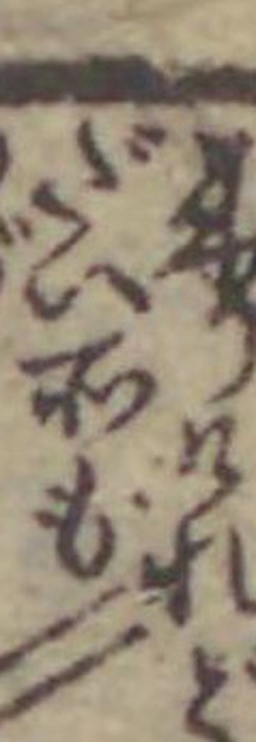だい所も
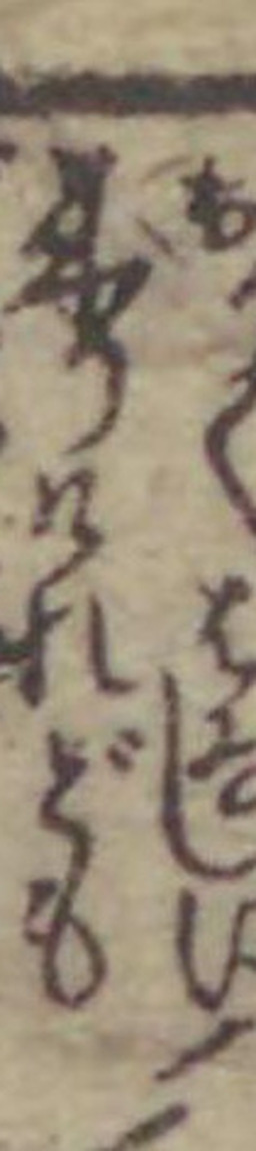来りけれども
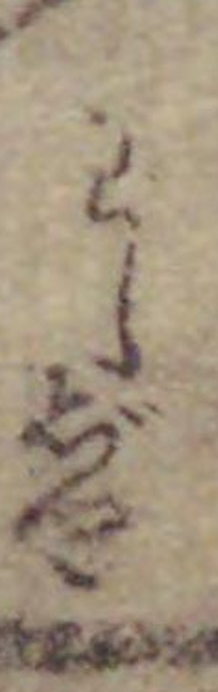わしじや
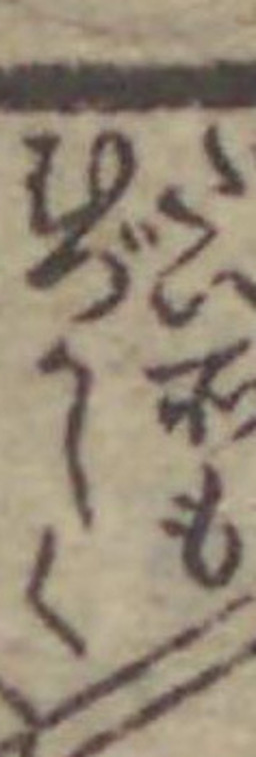むづかしく
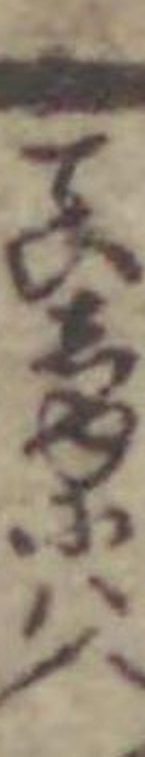ていしゆにハ
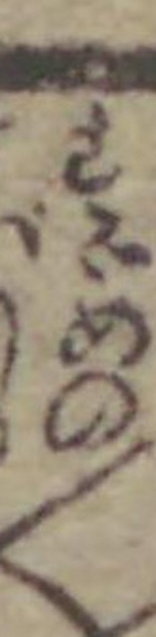すゞめの
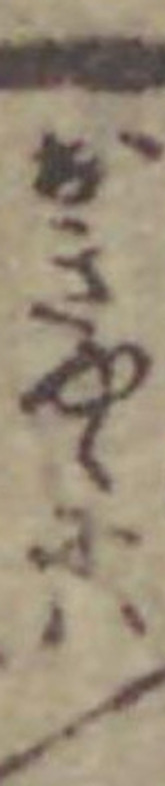おきやくにハ
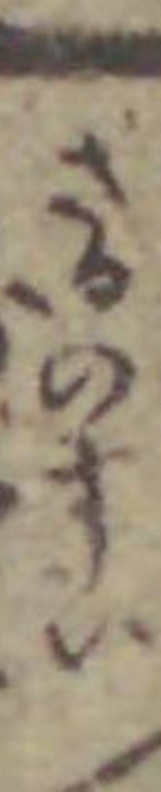さるのすい
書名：烏行水諺草 3巻
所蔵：国立国会図書館 National Diet Library, JAPAN
